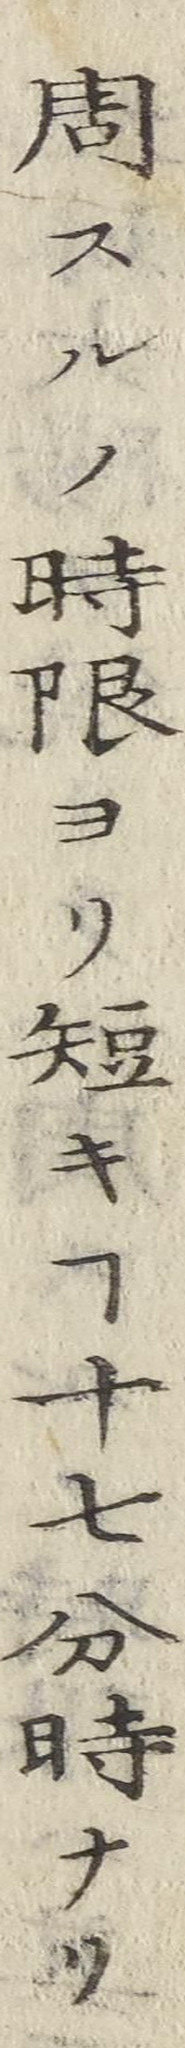周スルノ時限ヨリ短キコト十七分時ナリ
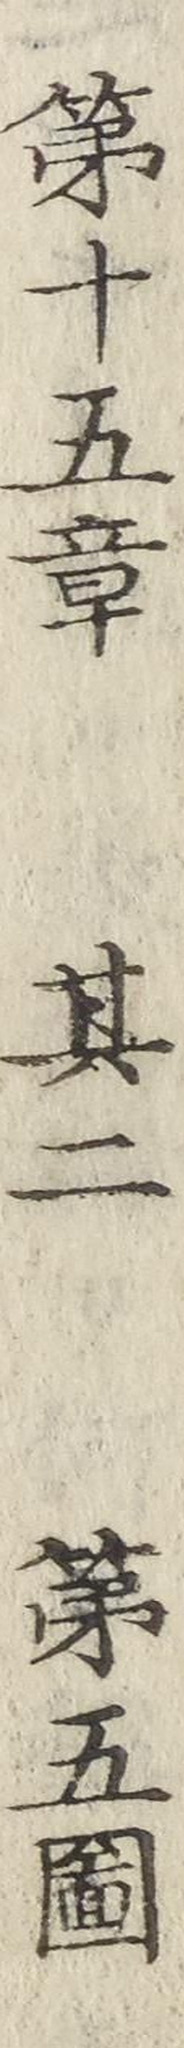第十五章其二第五図
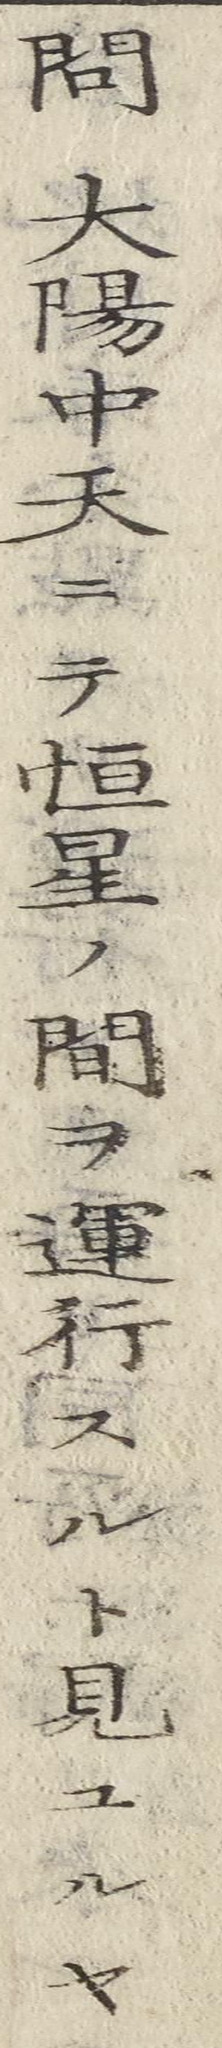問大陽中天ニテ恒星ノ間ヲ運行スルト見ユルヤ
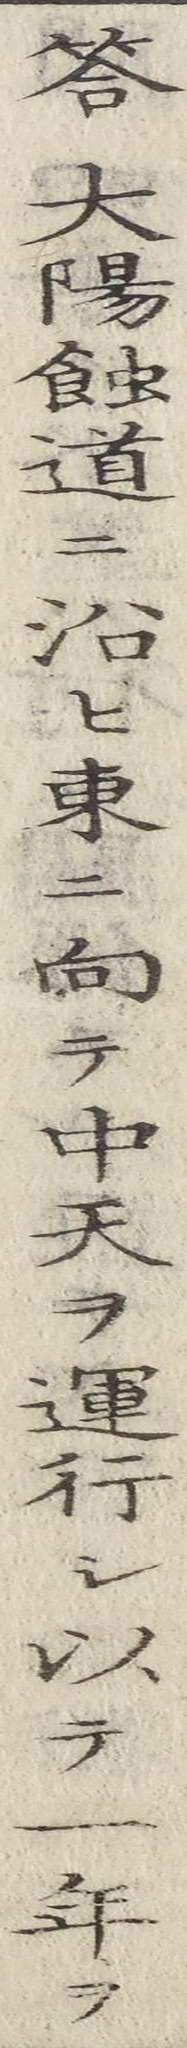答大陽蝕道ニ沿ヒ東ニ向テ中天ヲ運行シ以テ一年ヲ
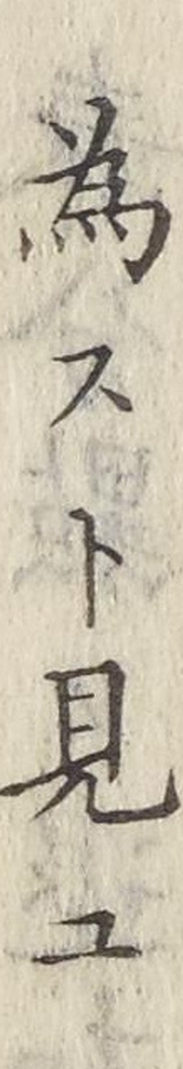為スト見ユ
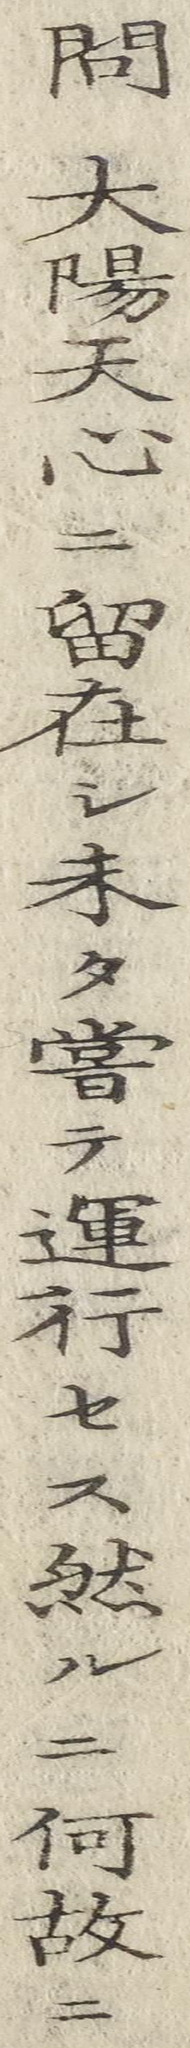問大陽天心ニ留在シ未タ嘗テ運行セス然ルニ何故ニ
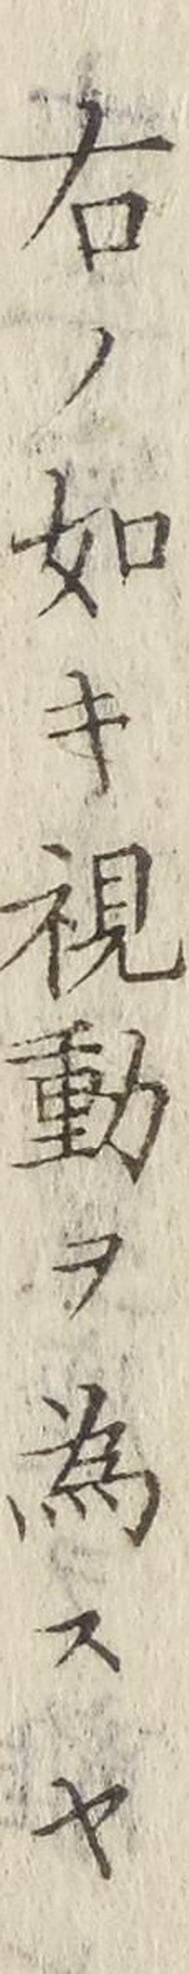右ノ如キ視動ヲ為スヤ
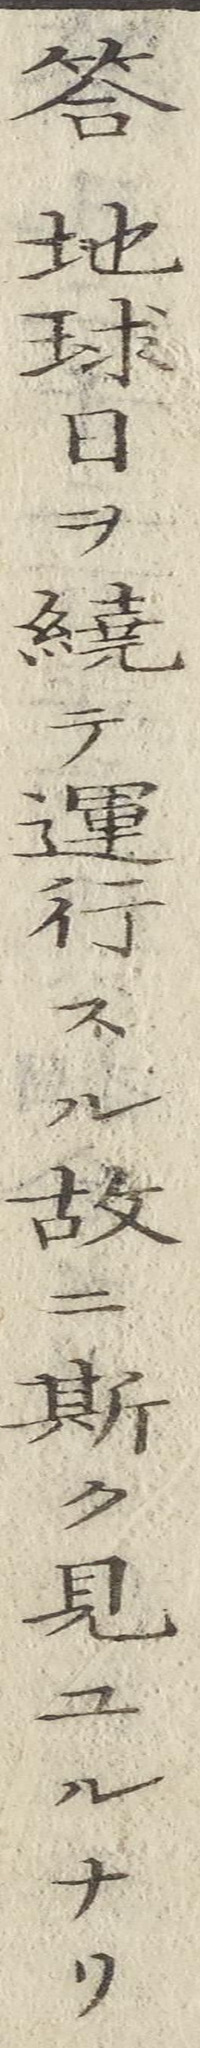答地球日ヲ繞テ運行スル故ニ斯ク見ユルナリ
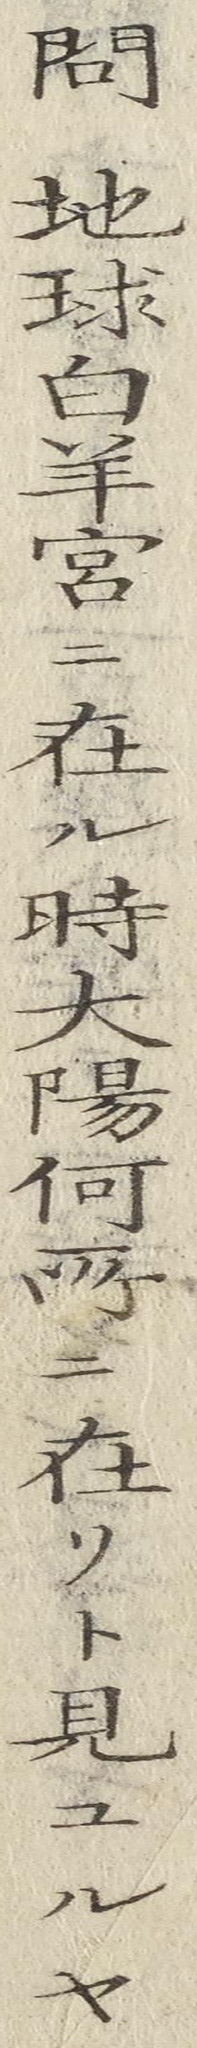問地球白羊宮ニ在ル時大陽何所ニ在リト見ユルヤ
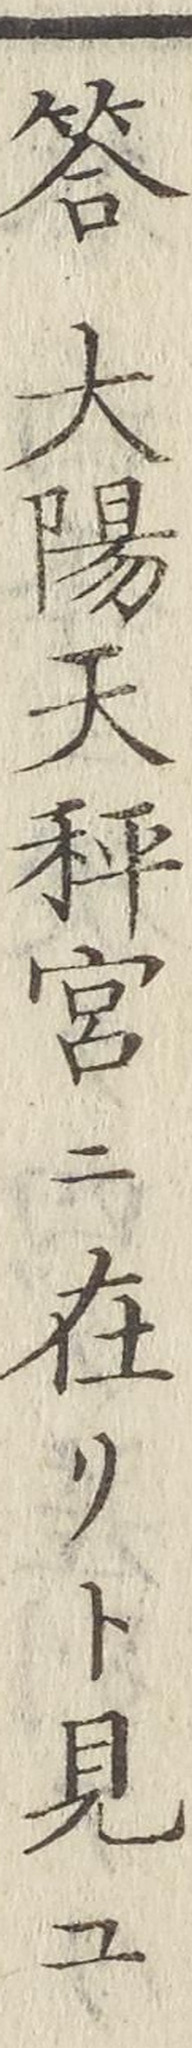答大陽天秤宮ニ在リト見ユ
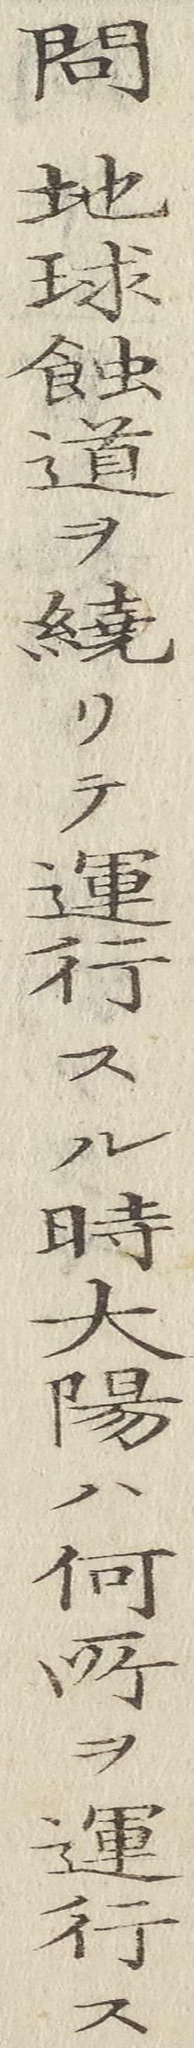問地球蝕道ヲ繞リテ運行スル時大陽ハ何所ヲ運行ス
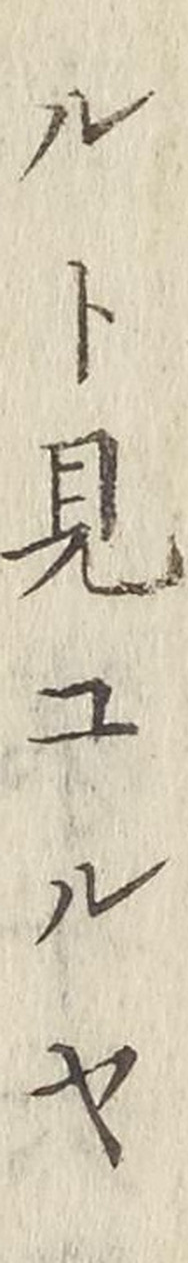ルト見ユルヤ
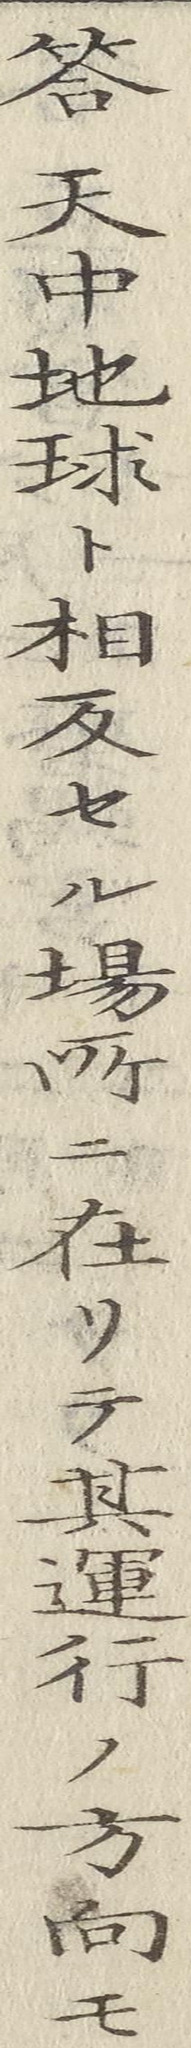答天中地球ト相反セル場所ニ在リテ其運行ノ方向モ
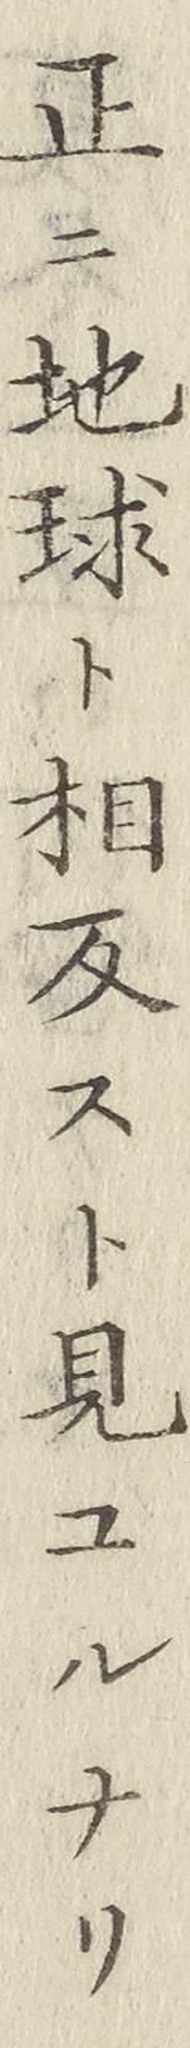正ニ地球ト相反スト見ユルナリ
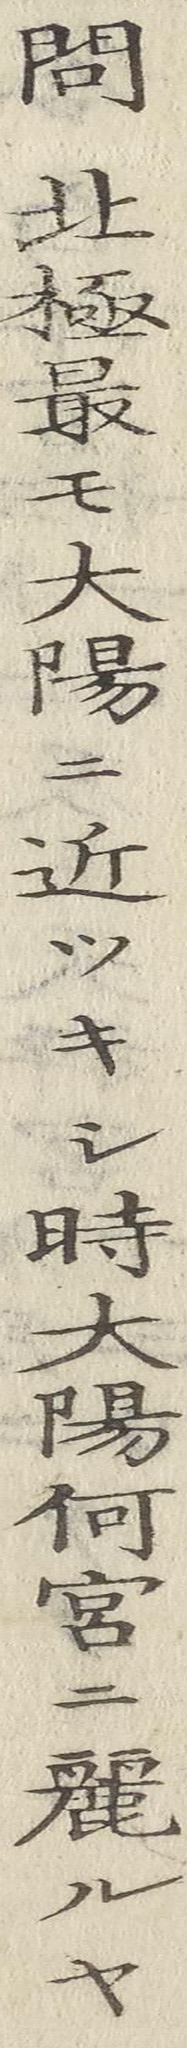問北極最モ大陽ニ近ツキシ時大陽何宮ニ麗ルヤ
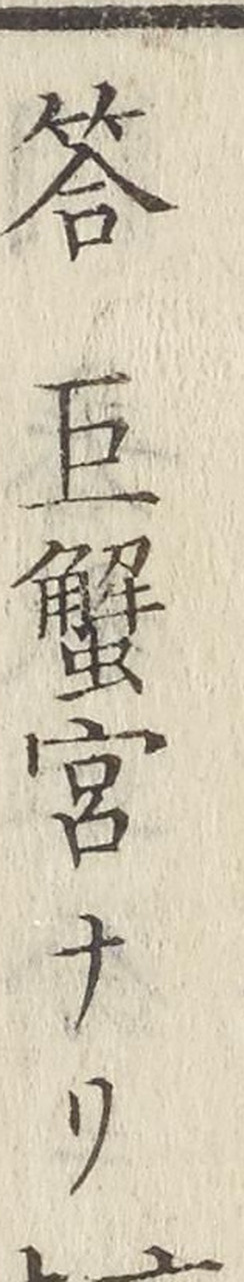答磨蝎宮ナリ
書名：星学圖説　上
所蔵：東京大学地震研究所図書室 Earthquake Research Institute Library, The University of Tokyo, JAPAN
